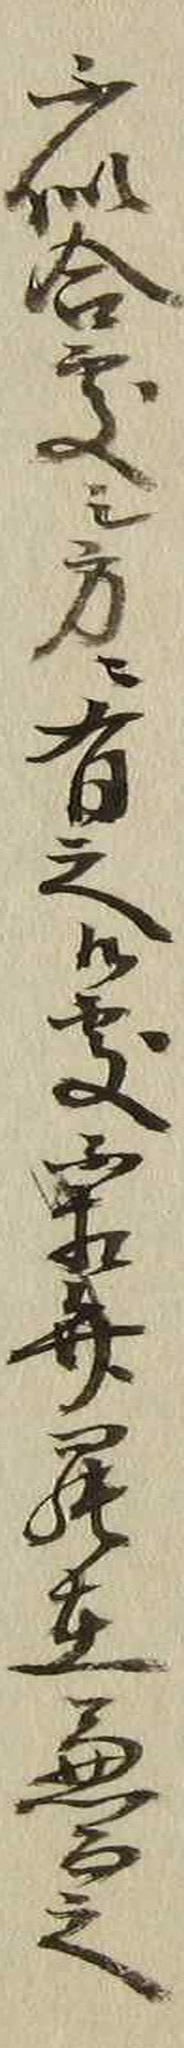不似合處シ方ニ有之候處不相弁罷在兼而之
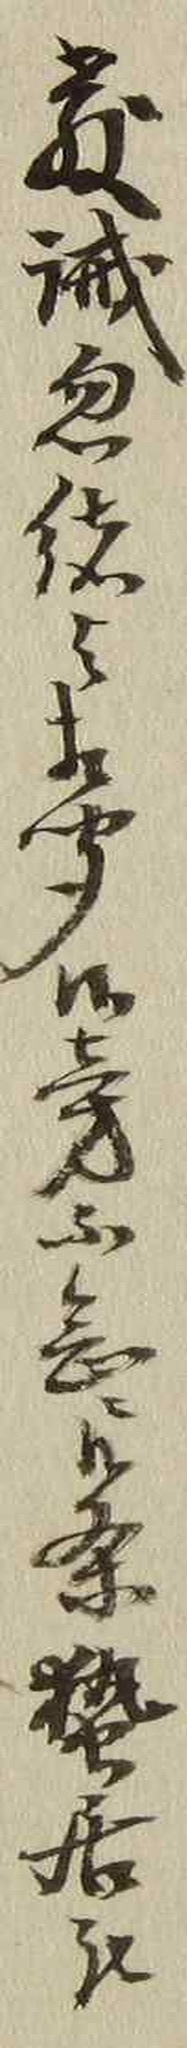教誡忽緒与相聞候旁不念ニ候条蟄居被
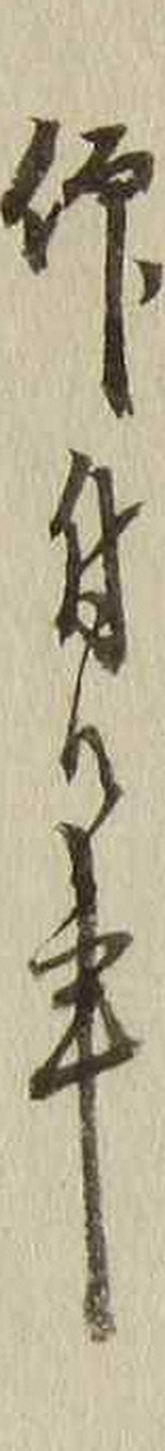仰付候事
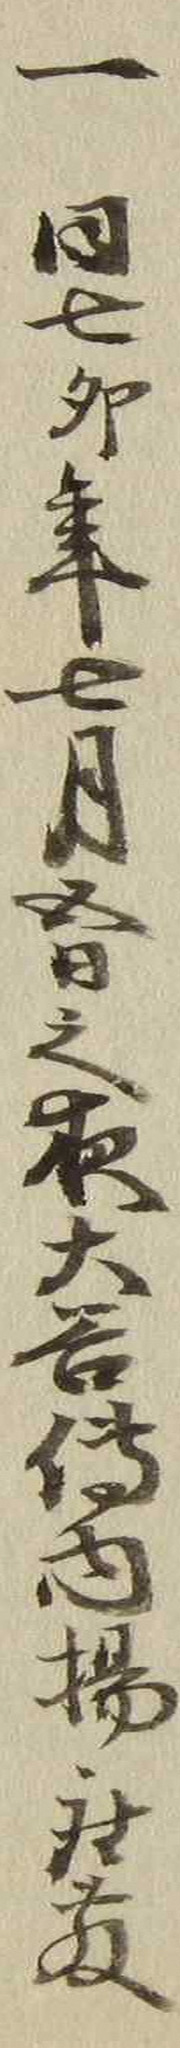一同七卯年七月五日之夜大谷伝内揚座敷
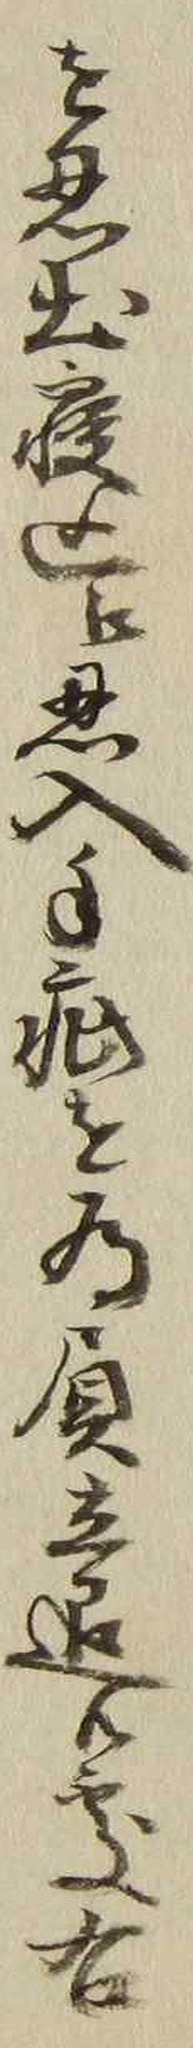を忍出寝込江忍入手疵を為負立退候處右
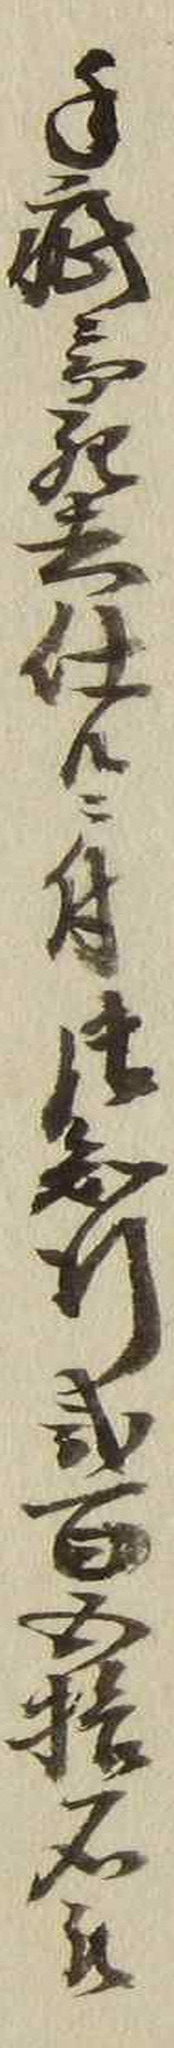手疵ニ而死去仕候ニ付御知行弐百五拾石被
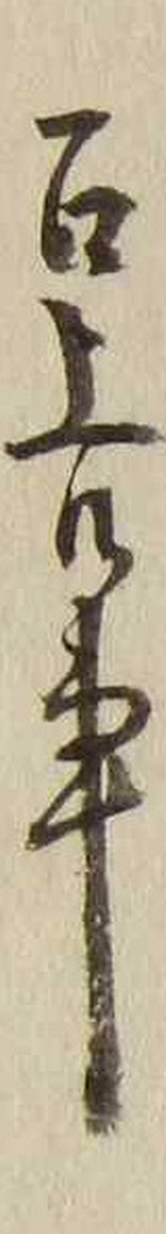召上候事

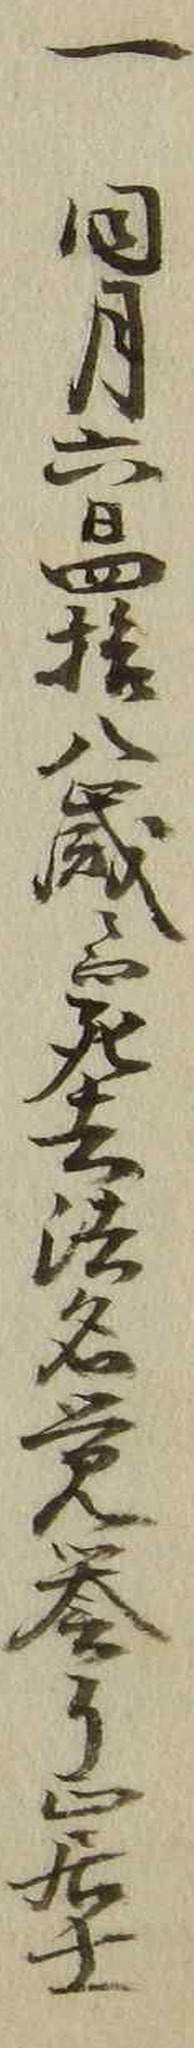一同月六日四拾八歳ニ而病死法名覚誉了正居士
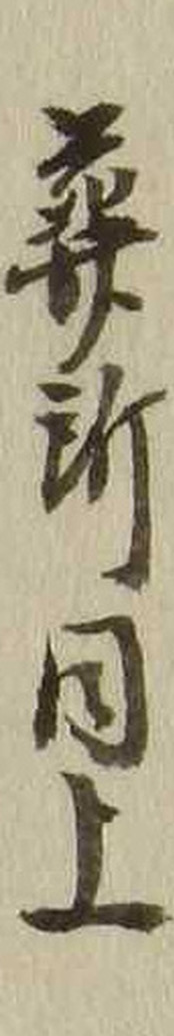葬所同上
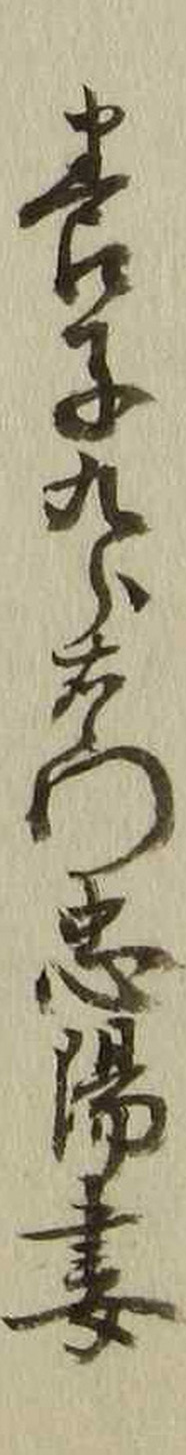女養子九郎右衛門忠陽妻
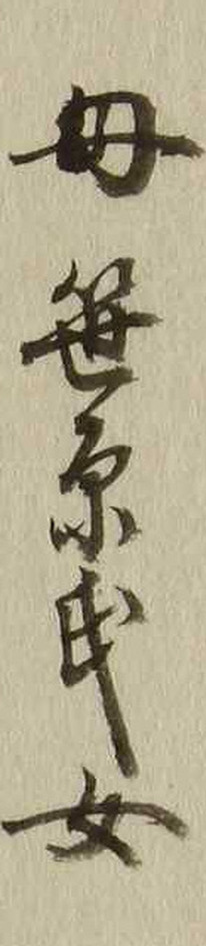母笹原氏女
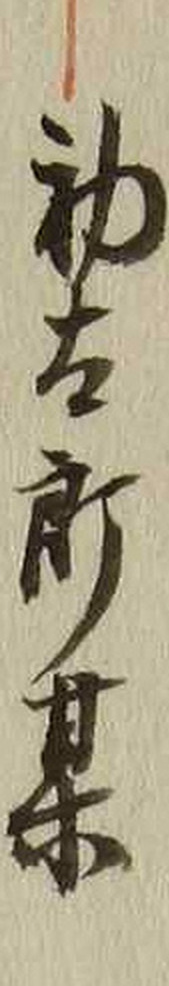勘太郎某
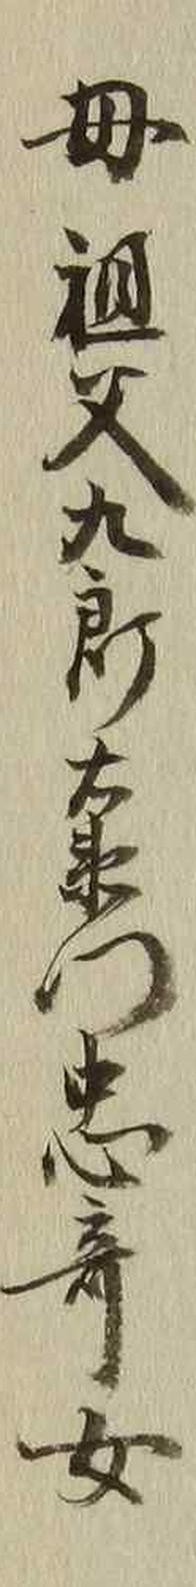母祖父九郎右衛門忠奇女
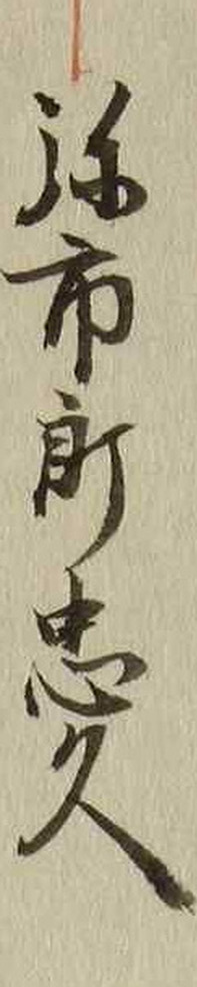弥一郎忠久
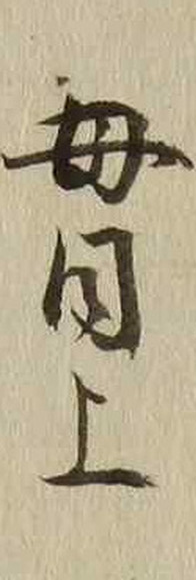母同上
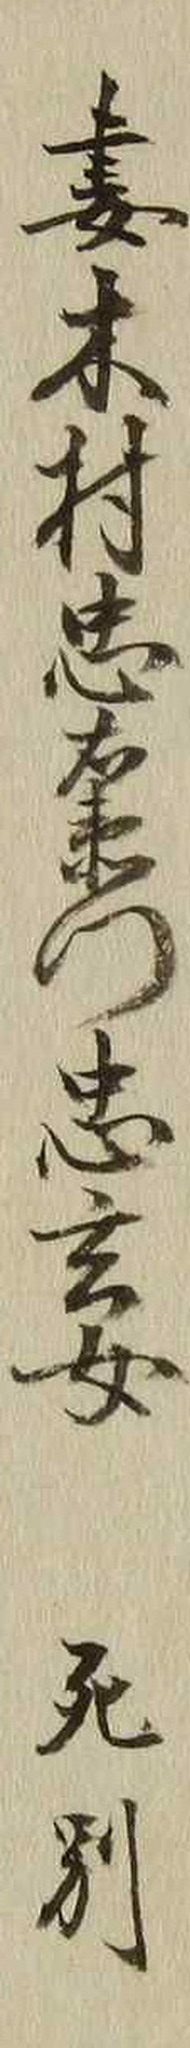妻木村忠右衛門忠玄女死別
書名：諸士系譜　巻之64　と之部7
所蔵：会津若松市立会津図書館
